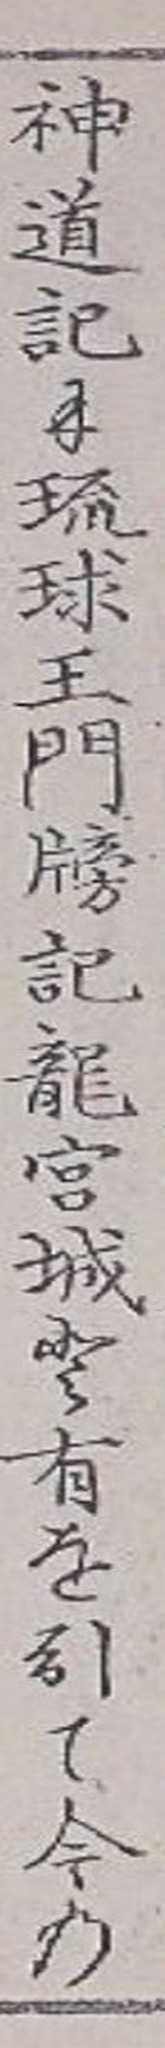神道記に琉球王門牓記竜宮城と有を引て今の
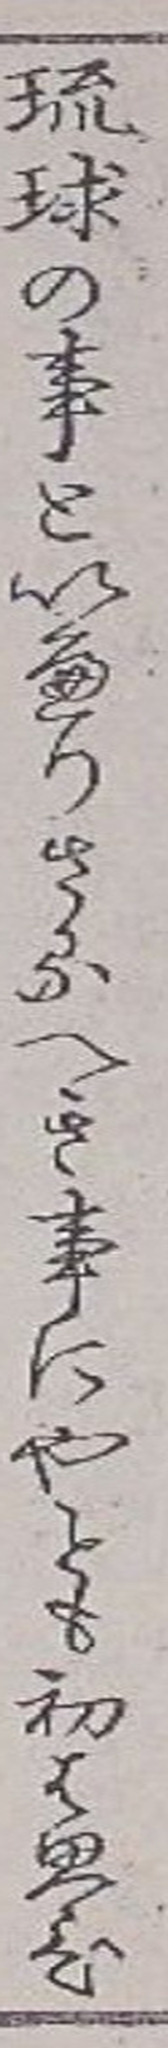琉球の事といへりさるへき事にやとも初は思ひ
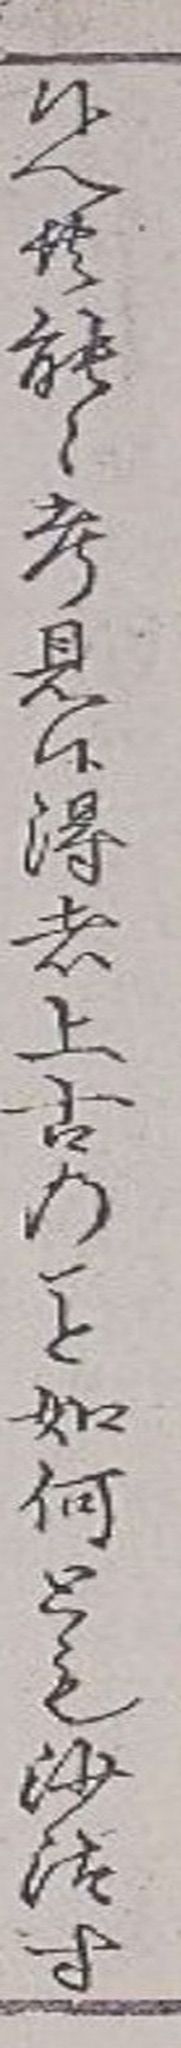候へ共能々考見候得は上古のこと如何とも沙汰す
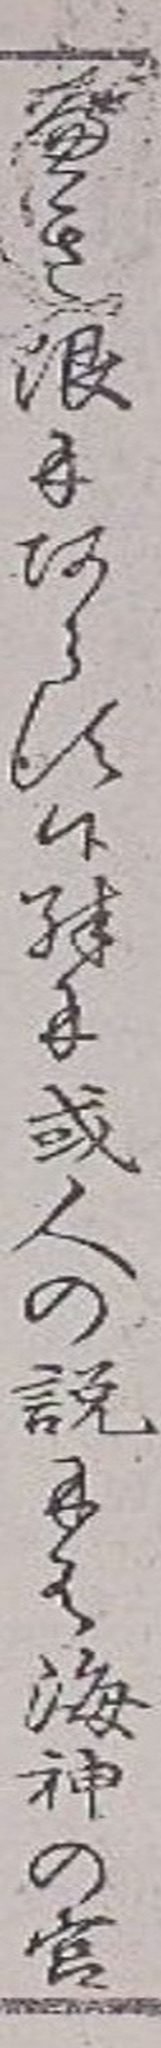へき限にあらす候殊に或人の説には海神の宮
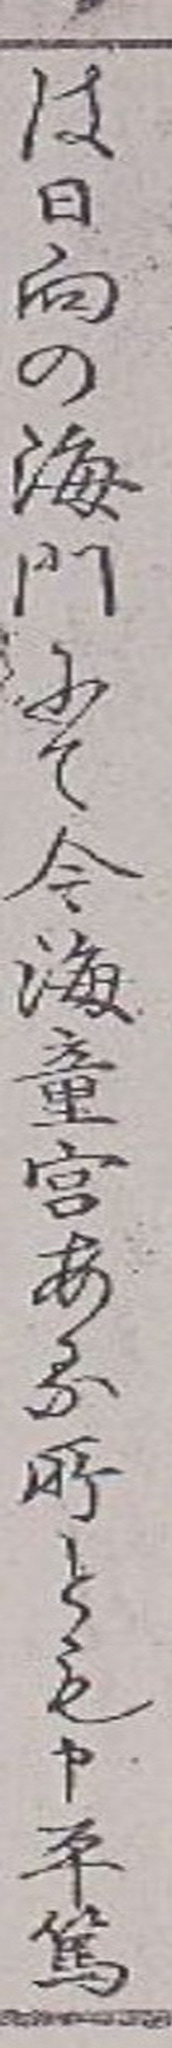は日向の海門にて今海童宮ある所とも申平篤
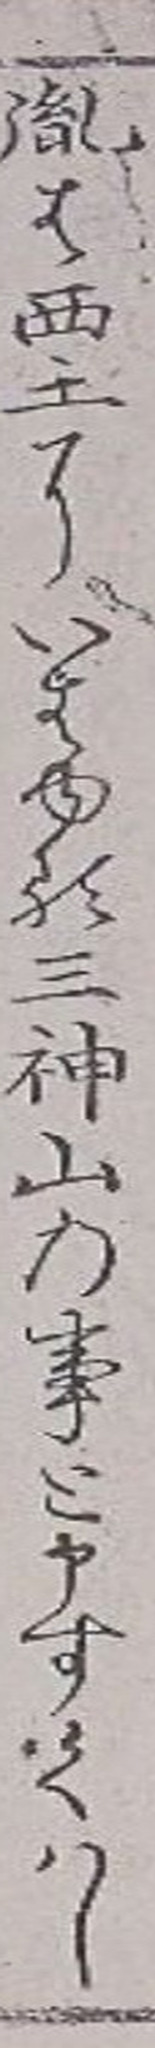胤は西土にいはゆる三神山の事と申すくはし

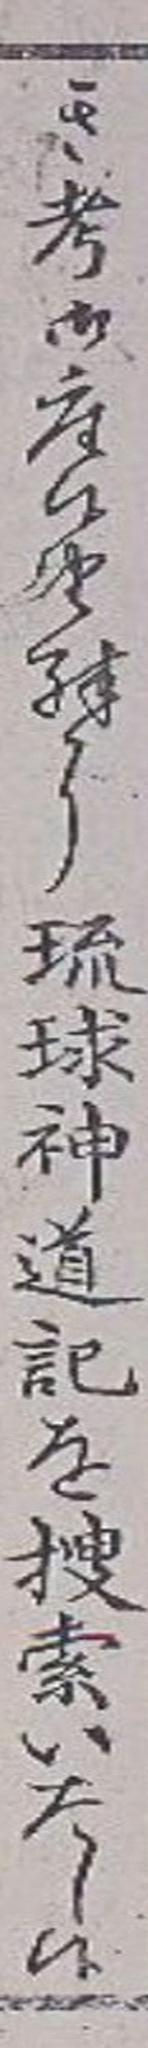き考御座候由殊に琉球神道記を捜索いたし候
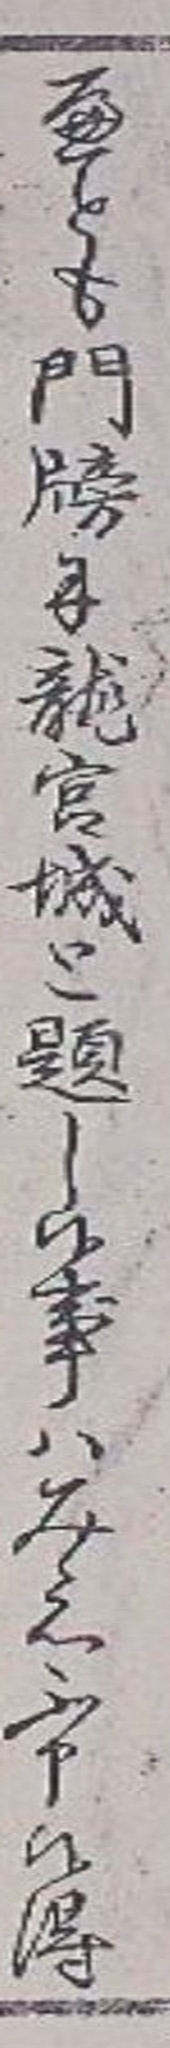へとも門牓に竜宮城と題し候事はみえ不申候得
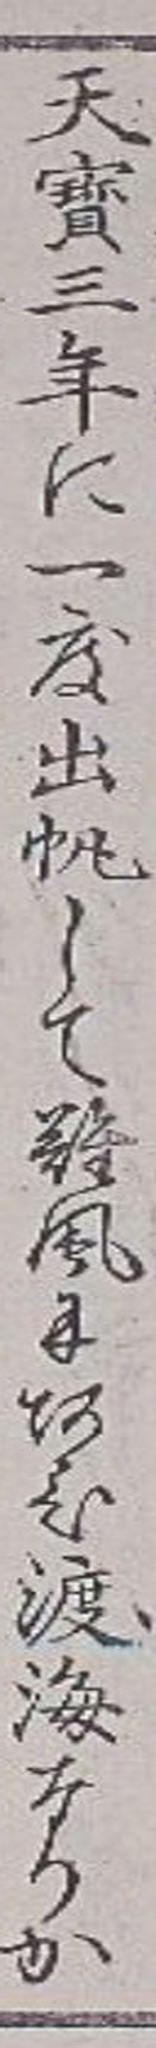天宝三年に一度出帆して難風にあひ渡海なりか
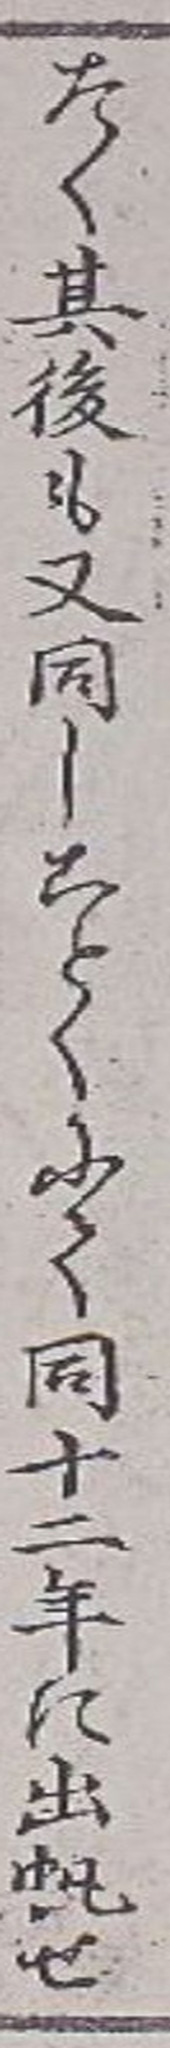たく其後も又同しことくにて同十二年に出帆せ
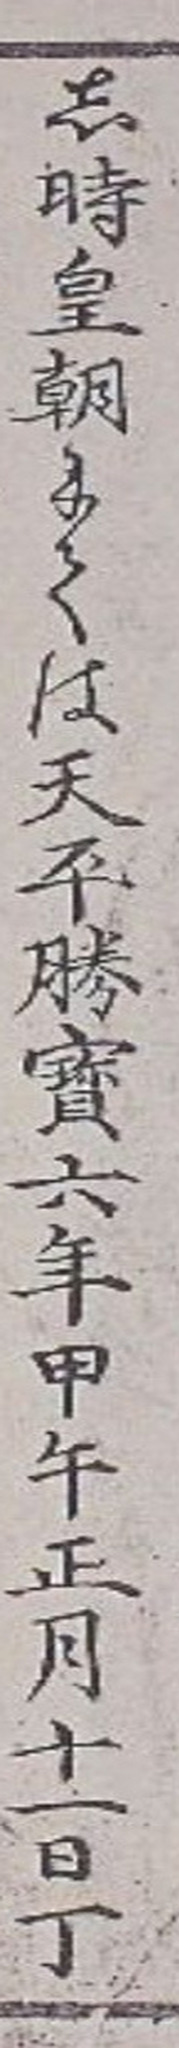し時皇朝にては天平勝宝六年甲午正月十一日丁
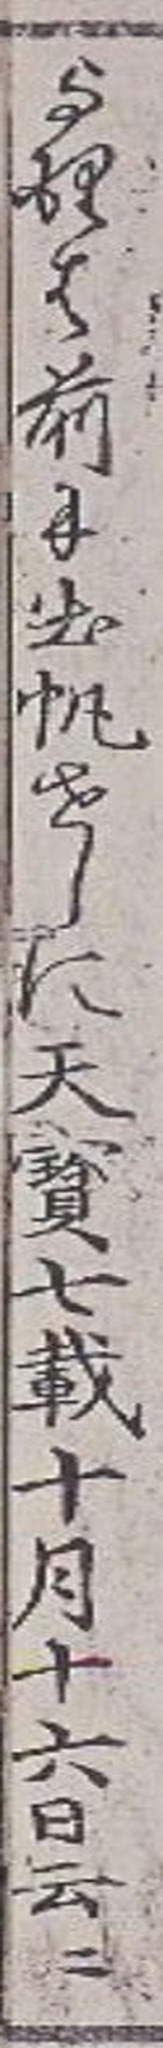よりは前に出帆せしに天宝七載十月十六日云に
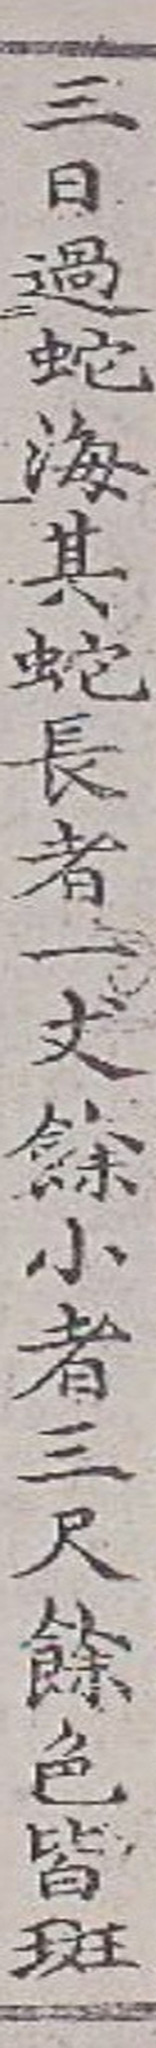三日過蛇海其蛇長は一丈余小は三尺余色皆斑
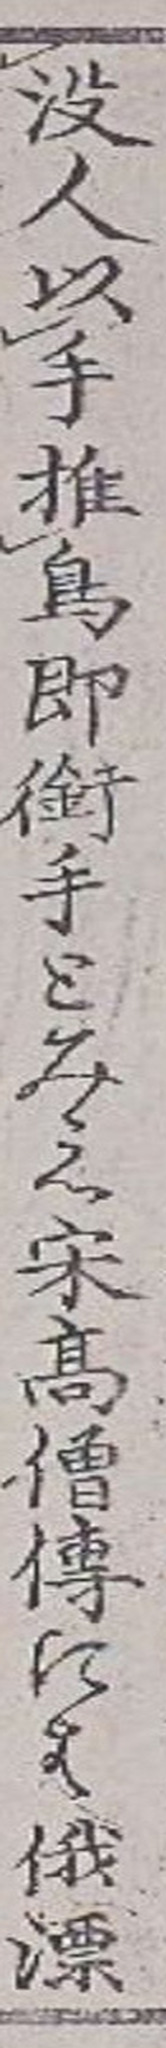没人以手推鳥即銜手とみえ宋高僧伝には俄漂
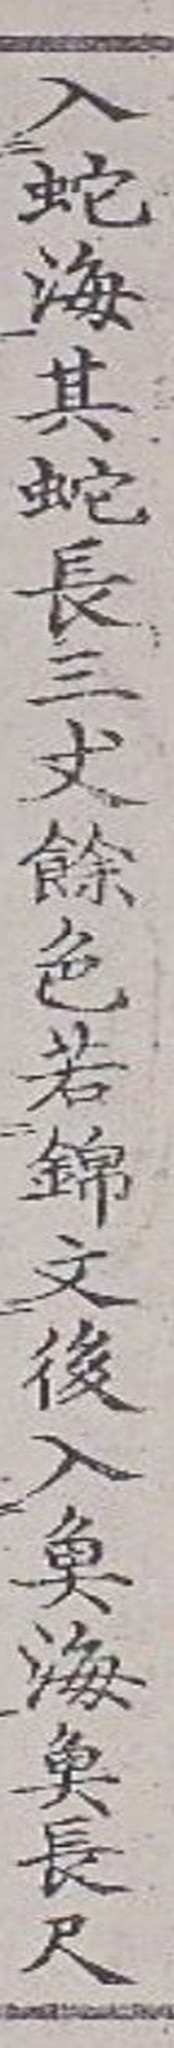入蛇海其蛇長三丈余色若錦文後入魚海魚長尺
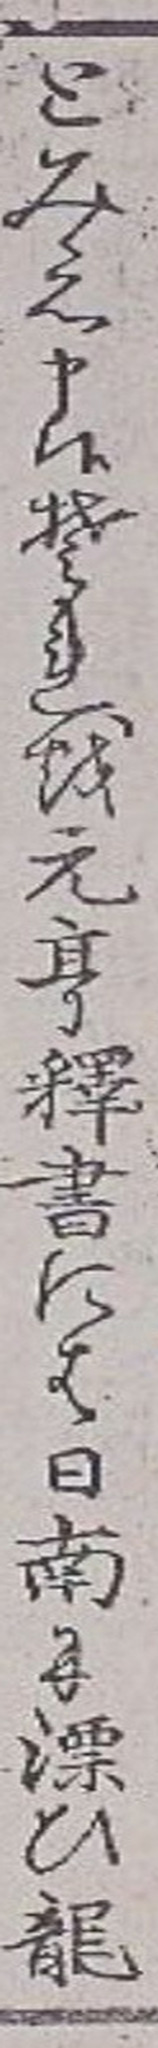とみえ申候それを元亨訳書には日南に漂ひ竜
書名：琉球状
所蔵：University of the Ryukyus Library
